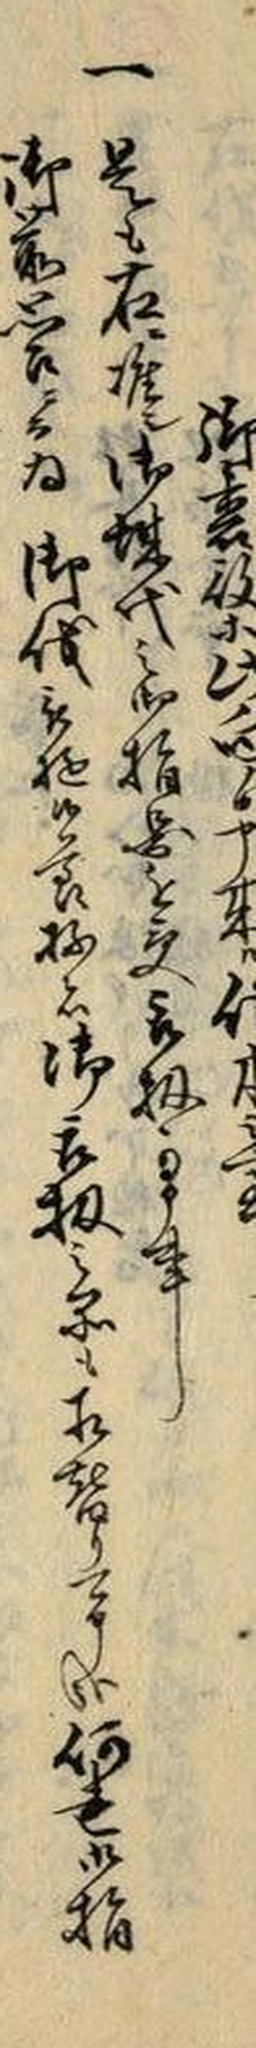御前思召にて為御伐被遊候節抔は御取扱之品も相替り可申哉何れ御指
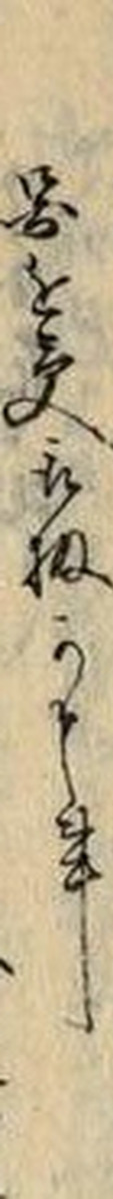図を受取扱可申事
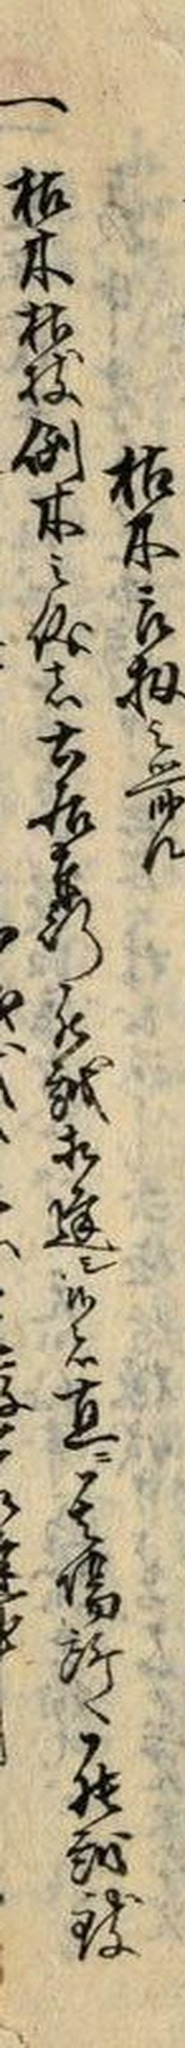一枯木枯枝倒木之儀は土居奉行罷越相達シ候は直に其場所へ罷越致
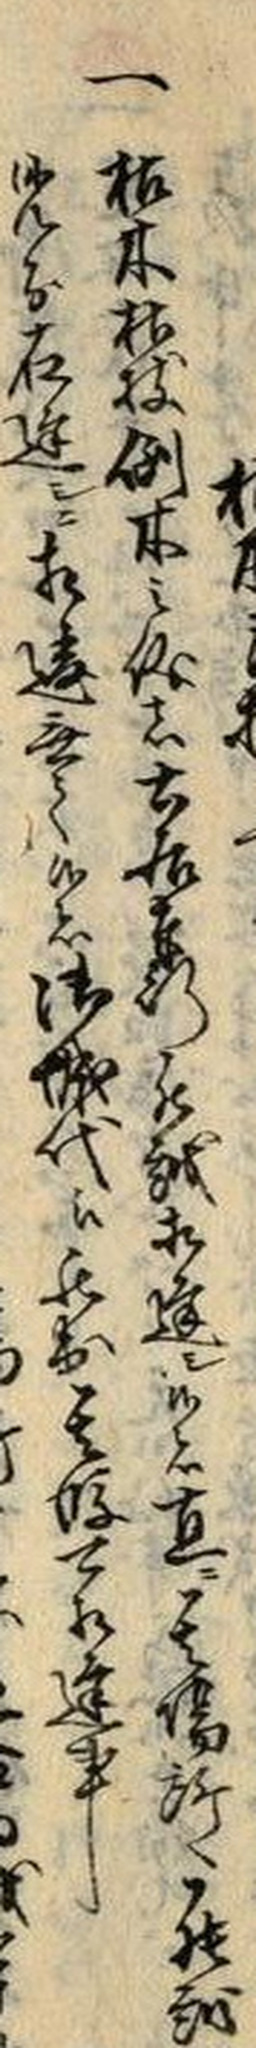見分右達シに相違無之候は御城代え罷出其段可相達事
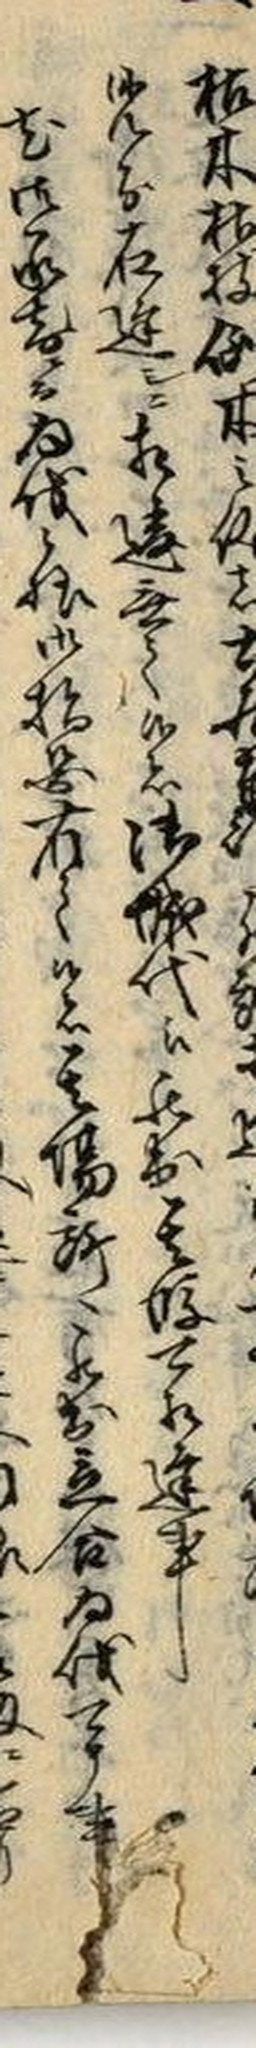尤御承知にて為伐候様御指図有之候は其場所へ罷出立合為伐可申事
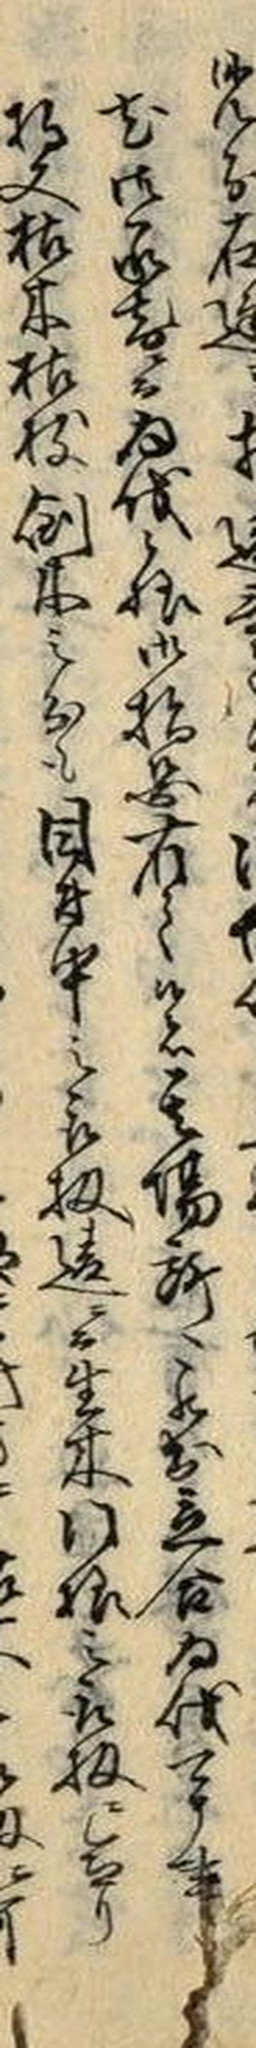将又枯木枯枝倒木之分も目付中之取扱違にて生木同様之取扱に至り
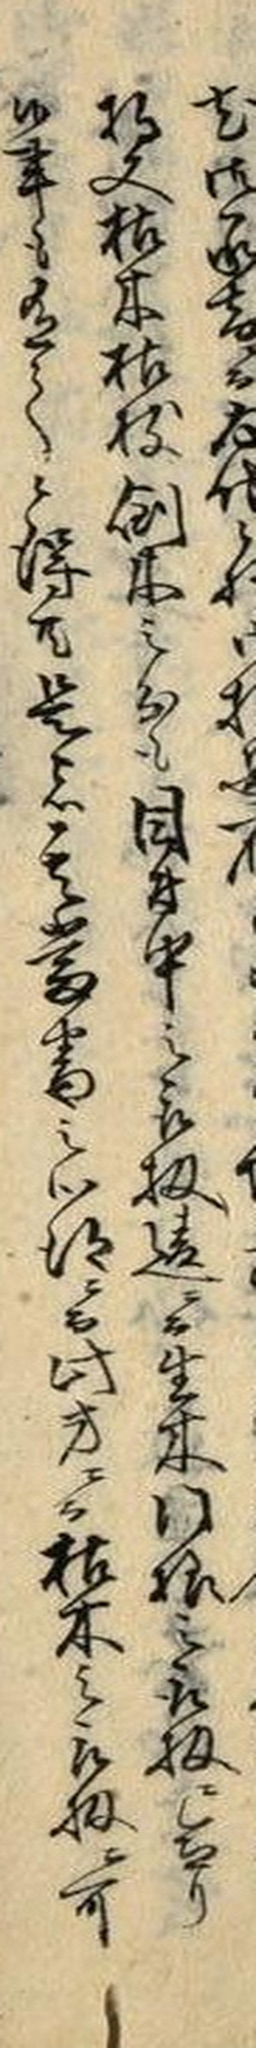候事も有之候得共是は其当番之心得にて此方にて枯木之取扱に可

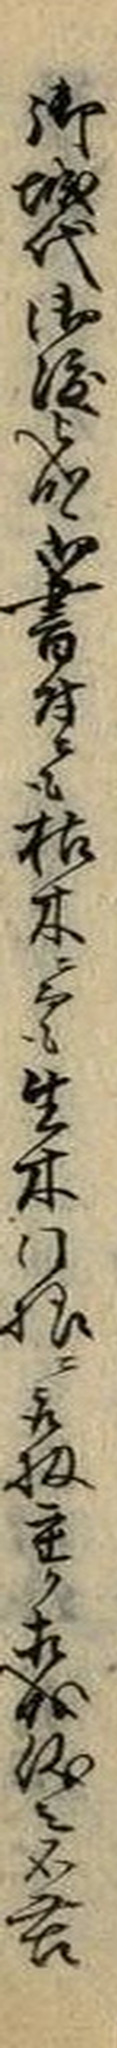御城代御渡被成候御書付にも枯木にても生木同様に取扱重ク相成儀は不苦
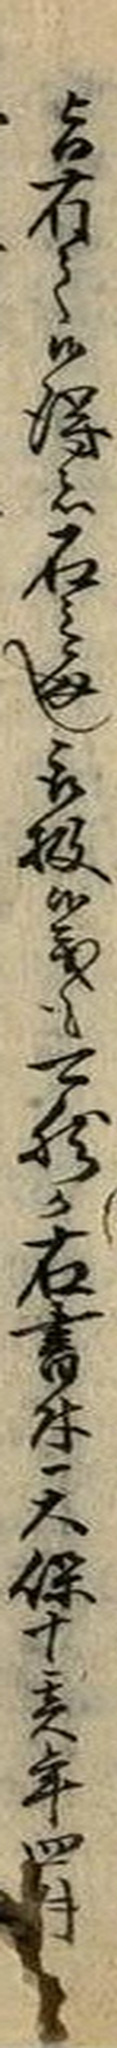旨有之候得は右之通取扱候義も可然ク右書付天保十亥年四月
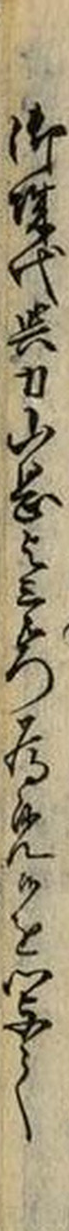御城代与力山岡与三左衛門為見候を写之
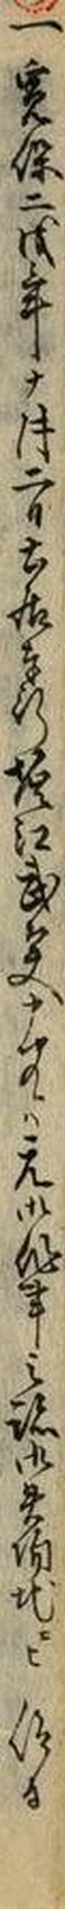○ろ一寛保二戌年十月二日土居奉行堀江武大夫申聞候は元御作事之跡矢場地に被仰付
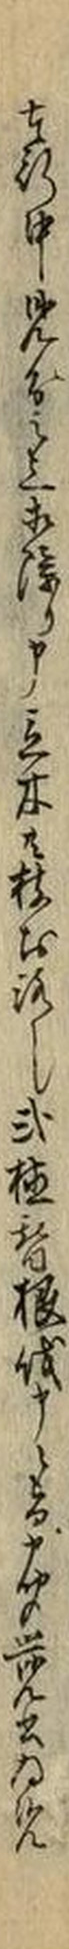奉行中見分之上相障り申立木共枝おろし或植替根伐申候旨申聞覚書為見
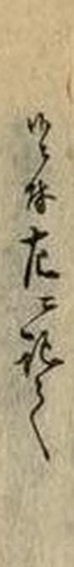候に付左に記之
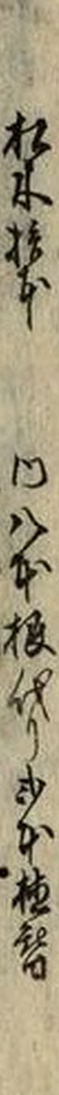松木拾本内八本根伐り弐本植替
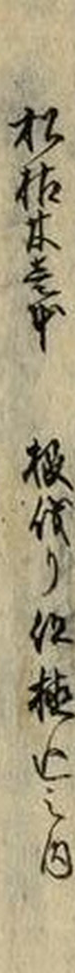松枯木壱本根伐り但植込之内
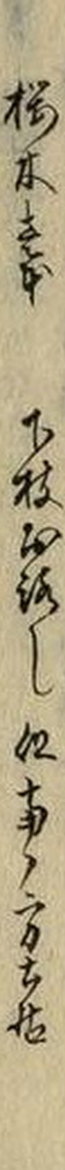桜木壱本下枝おろし但南ノ方土居
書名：御城下諸事之部
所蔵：福井県文書館 Fukui Prefectural Archives
